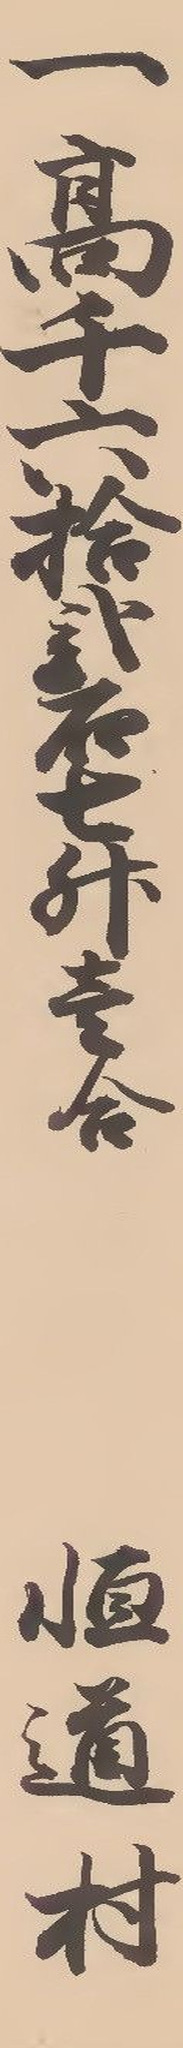一高千六拾弐石七升壱合恒道村
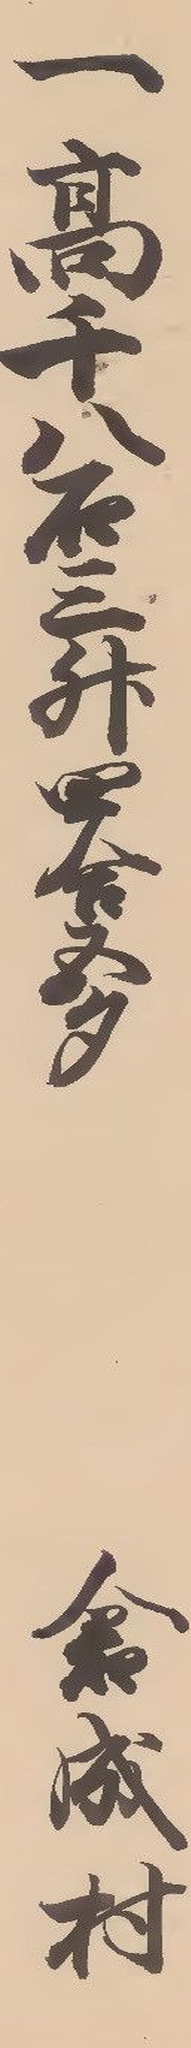一高千八石三升四合五勺倉成村
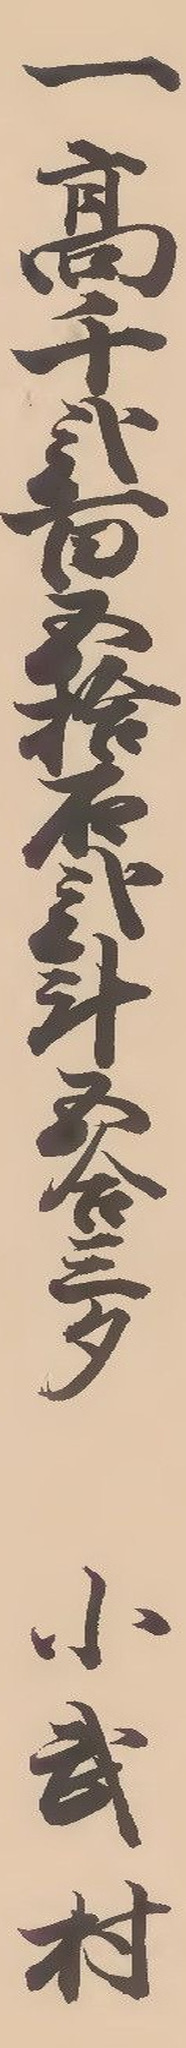一高千弐百五拾石弐斗五合三勺小武村
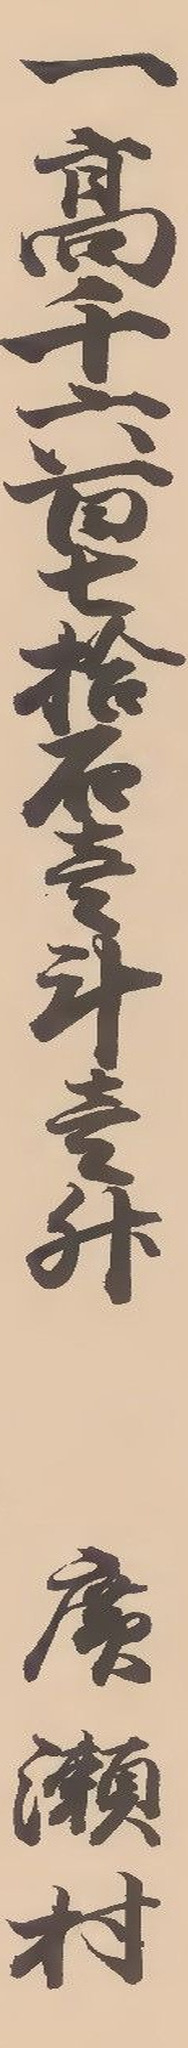一高千六百七拾石壱斗壱升広瀬村
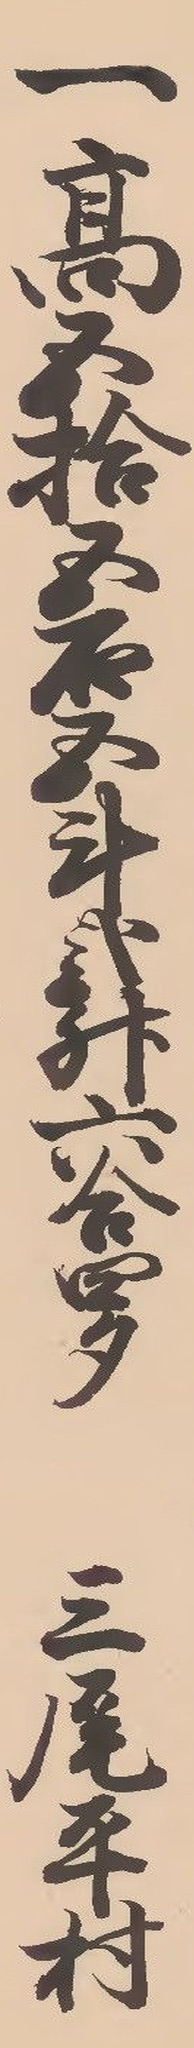一高五拾五石五斗弐升六合四勺三尾平村
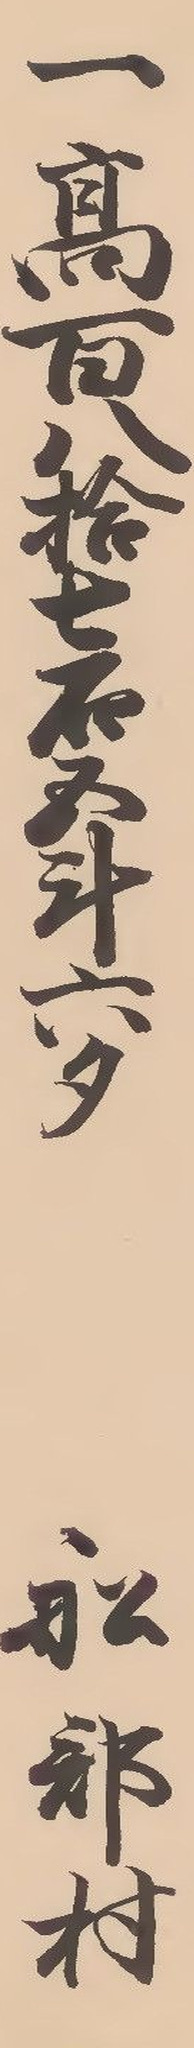一高百八拾七石五斗六勺船部村
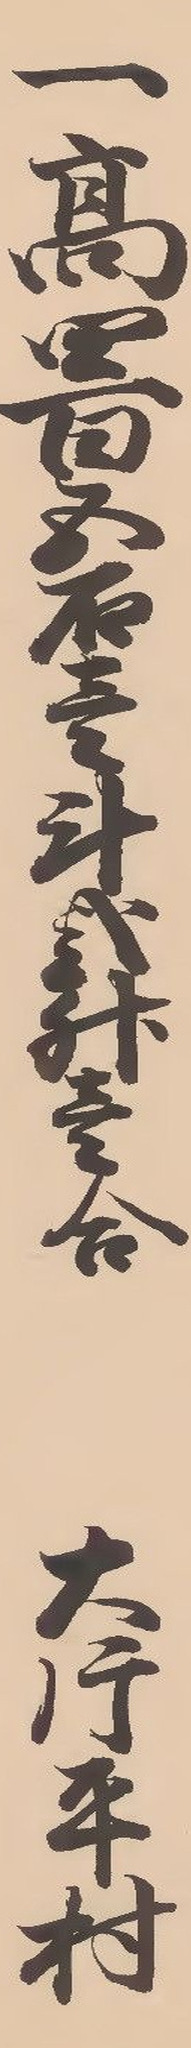一高四百五石壱斗弐升壱合大片平村
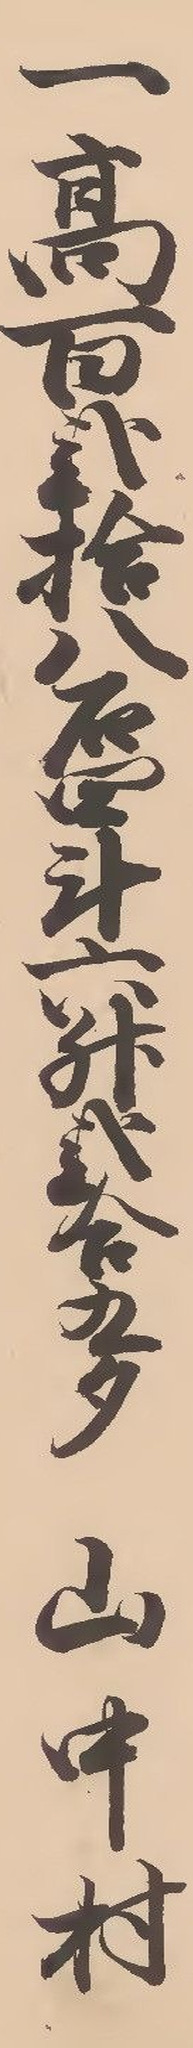一高百弐拾八石四斗六升弐合九勺山中村

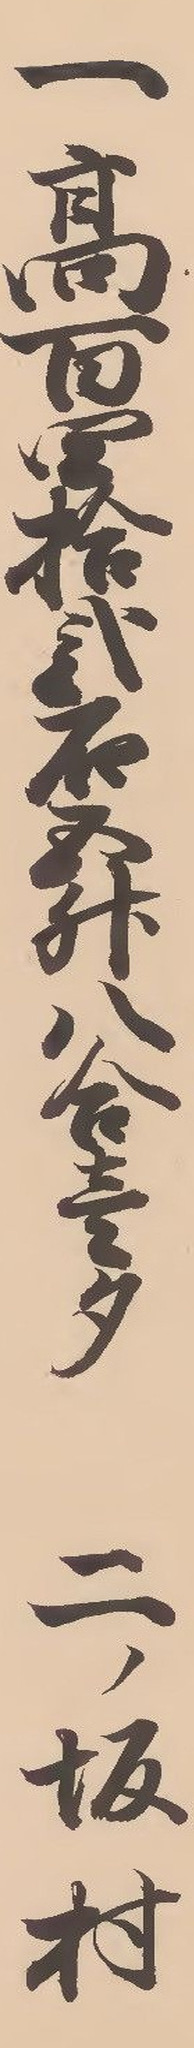一高百四拾弐石五升八合壱勺二ノ坂村
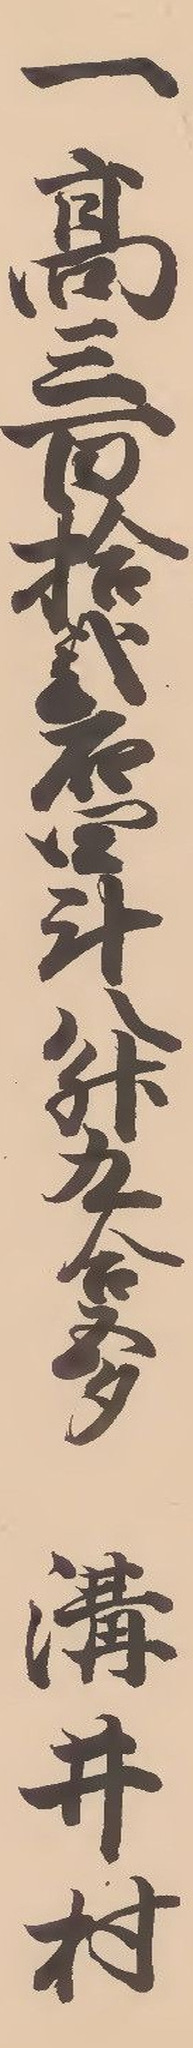一高三百拾弐石四斗八升九合五勺溝井村
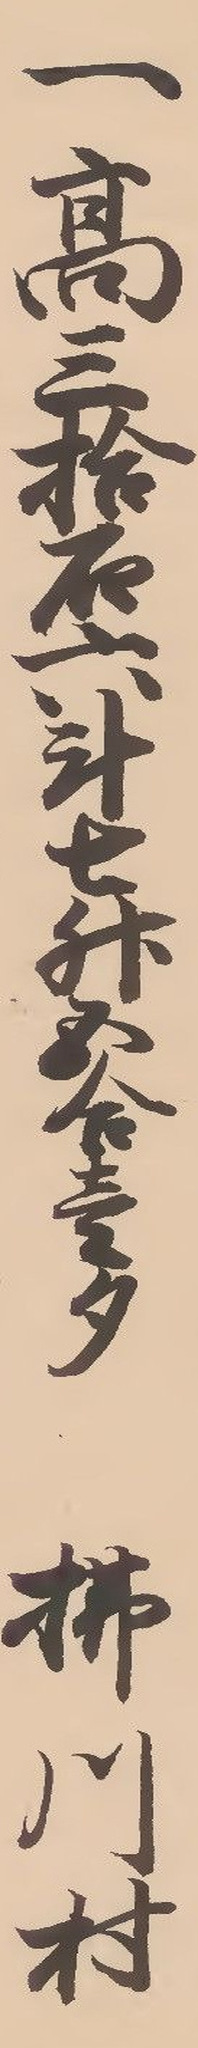一高三拾石六斗七升五合壱勺払川村
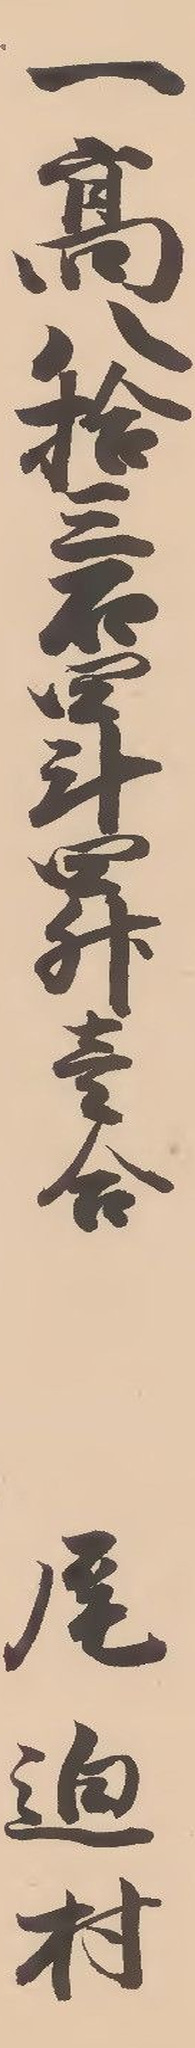一高八拾三石四斗四升壱合尾迫村
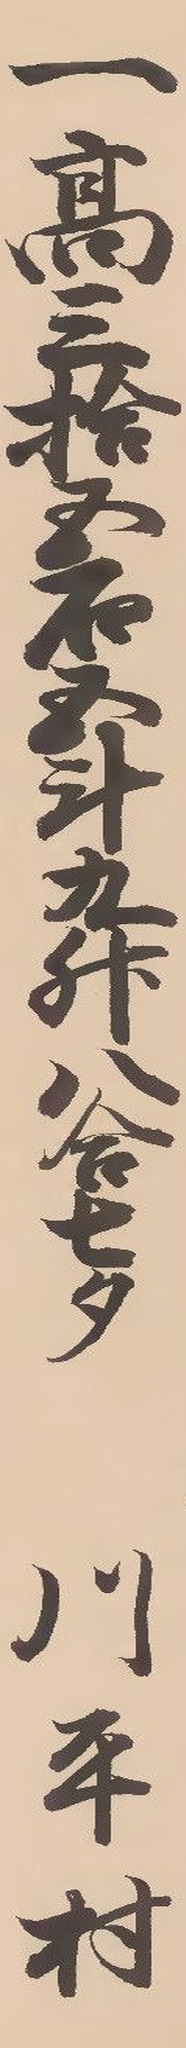一高三拾五石五斗九升八合七勺川平村
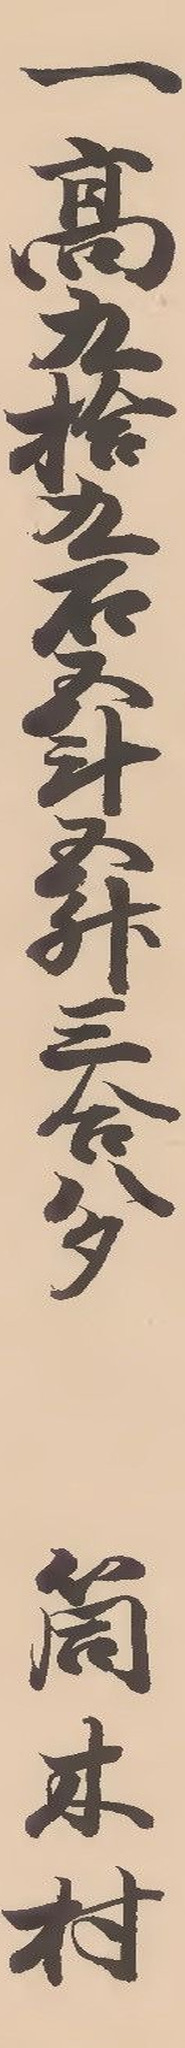一高九拾九石五斗五升三合八勺筒木村
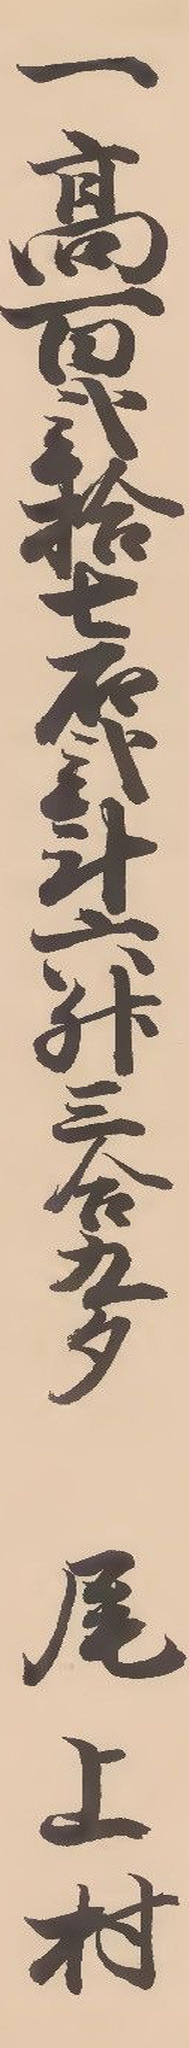一高百弐拾七石弐斗六升三合九勺尾上村
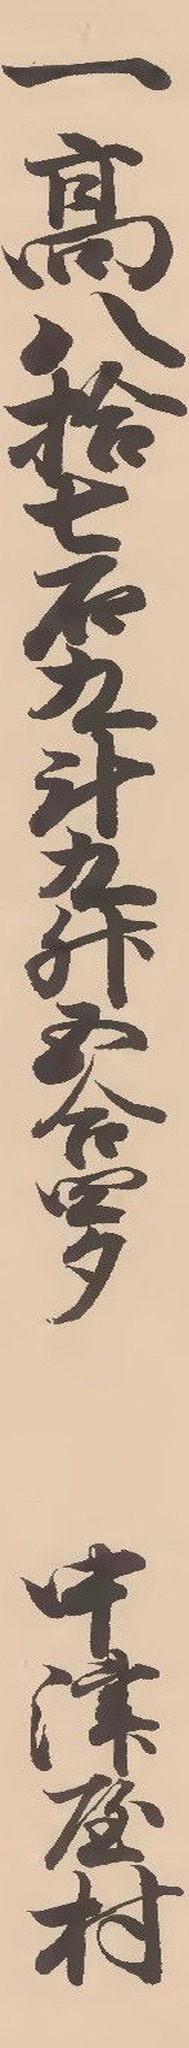一高八拾七石九斗九升五合四勺中津屋村
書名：豊後国郷帳
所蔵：国立公文書館 National Archives of Japan
